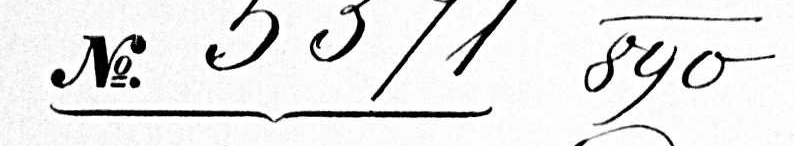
No. 5371 890
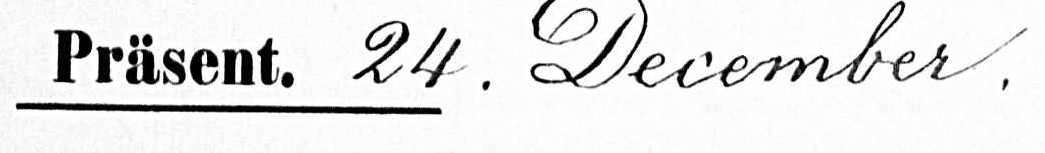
Präsent. 24. December.
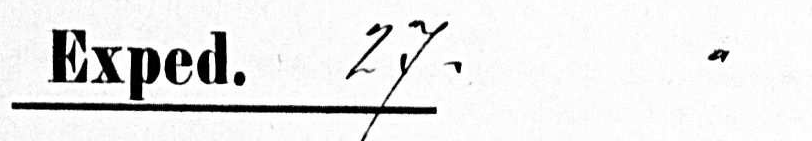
Exped. 27. December.
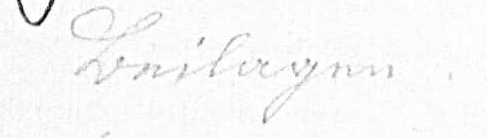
Beilagen.
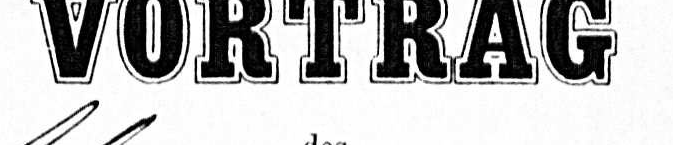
Vortrag
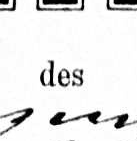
des
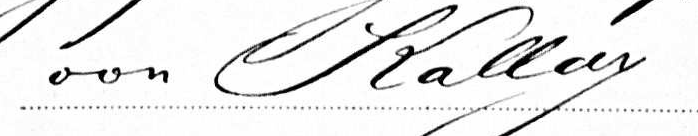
von Kallay
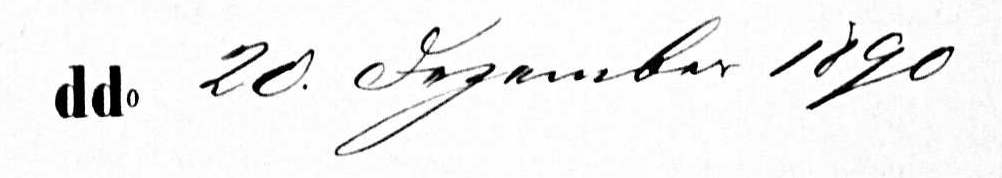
ddo 20. Dezember 1890
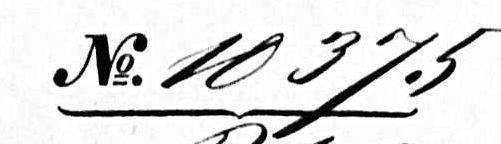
No. 10375
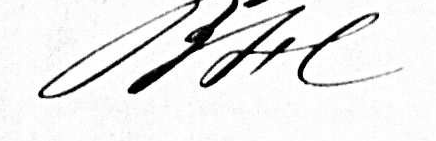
BH
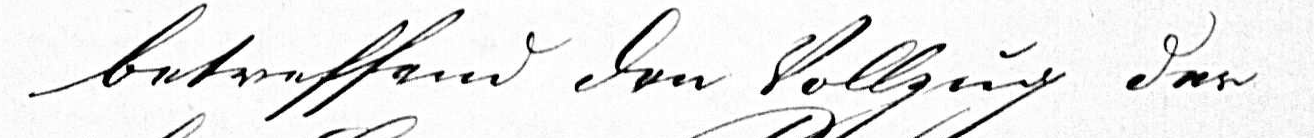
betreffend den Vollzug der
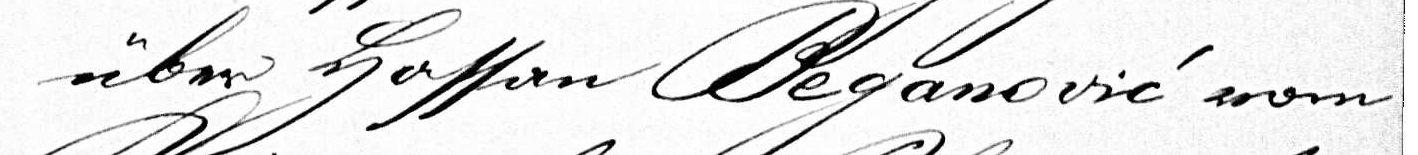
über Hassan Beganović vom
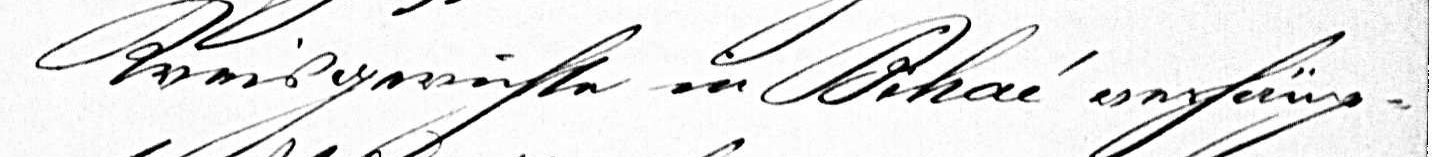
Kreisgerichte in Bihać verhäng¬
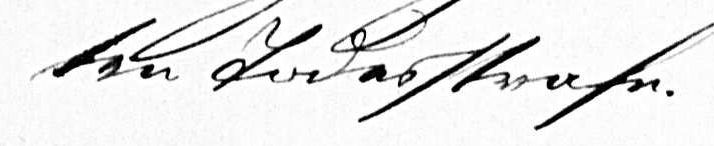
ten Todesstrafe.
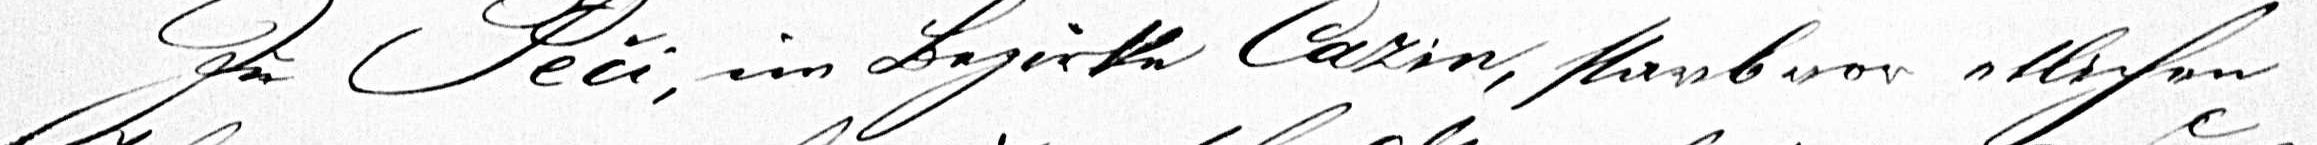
Zu Peči, im Bezirke Cazin, starb vor etlichen
